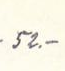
52
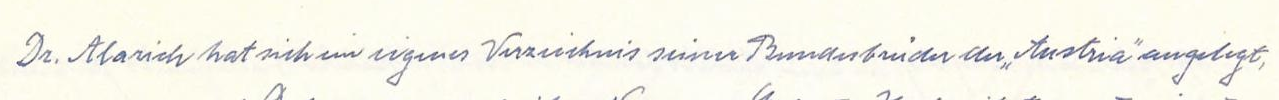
Dr. Alarich ich hat sich ein eigenes Verzeichnis seiner Bundesbrüder der Austria angelegt,
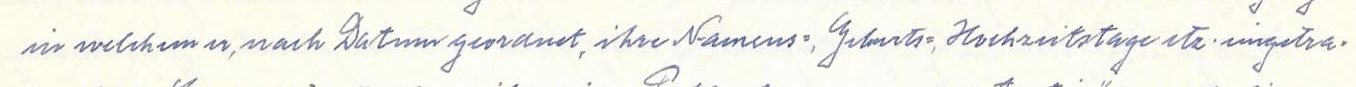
in welchem er, nach Datum geordnet, ihre Namens-, Geburts- Hochzeitstage etc. eingetra-
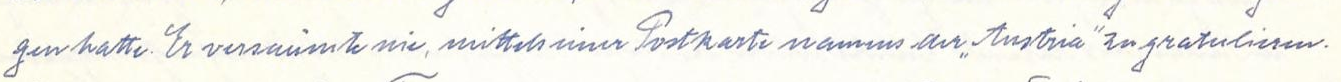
gen hatte. Er versäumte nie, mittels einer Postkarte namens der „Austria“ zu gratulieren.
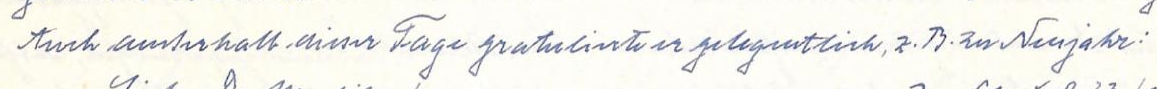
Auch außerhalb dieser Tage gratulierte er gelegentlich, z. B. zu Neujahr:
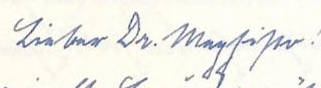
Lieber Dr. Mephisto!
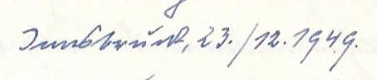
Innsbruck, 23./12.1949
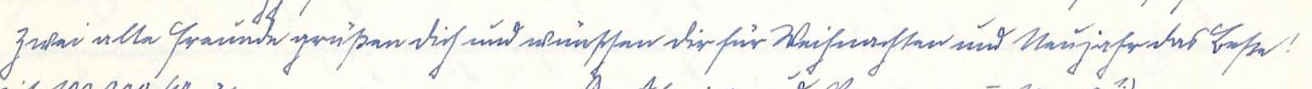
Zwei alte Freunde grüßen sich und wünschen dir für Weihnachten und Neujahr das Beste!
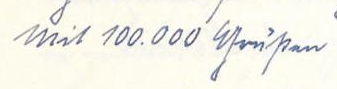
Mit 100.000 Grüßen
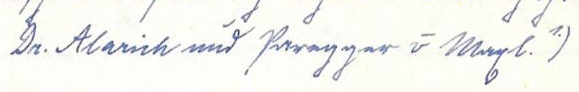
Dr. Alarich und Parigger v/o Mayl 1)
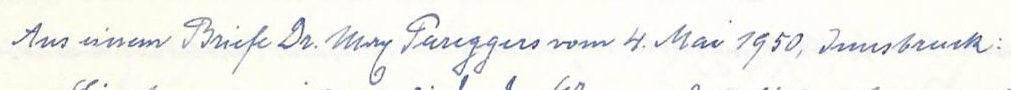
Aus einem Briefe Dr. Max Pariggers vom 4. Mai 1950, Innsbruck:
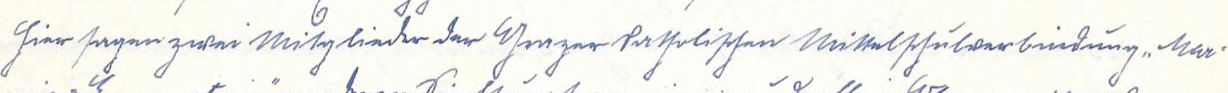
Hier sagen zwei Mitglieder der Grazer katholischen Mittelschulverbindung „Mar-
